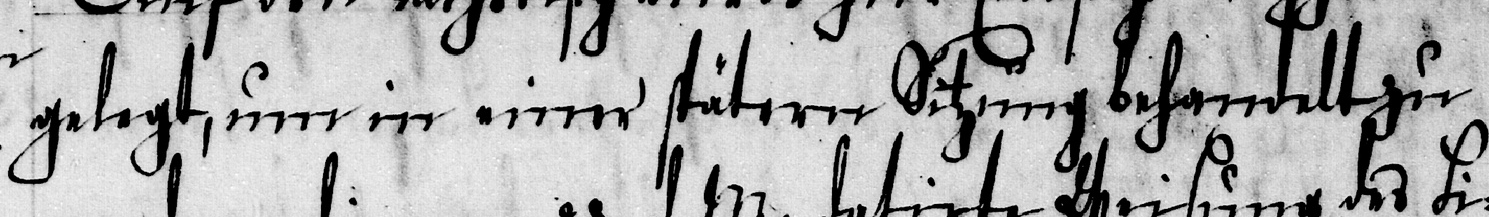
gelegt, um in einer spätern Sitzung behandelt zu
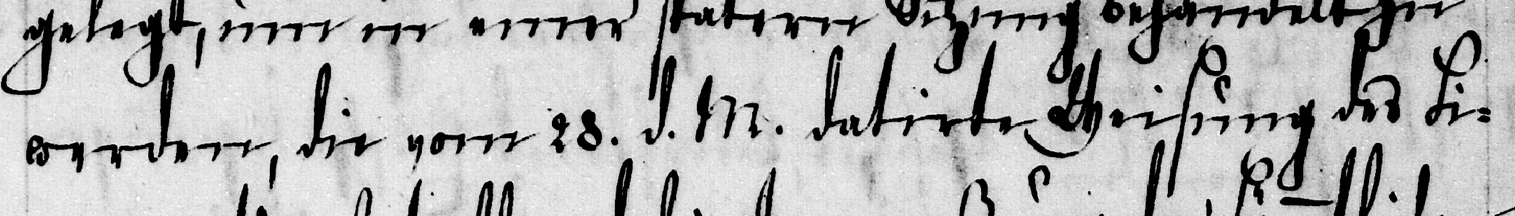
werden, die vom 28. d. M. datirte Weisung des Fi¬
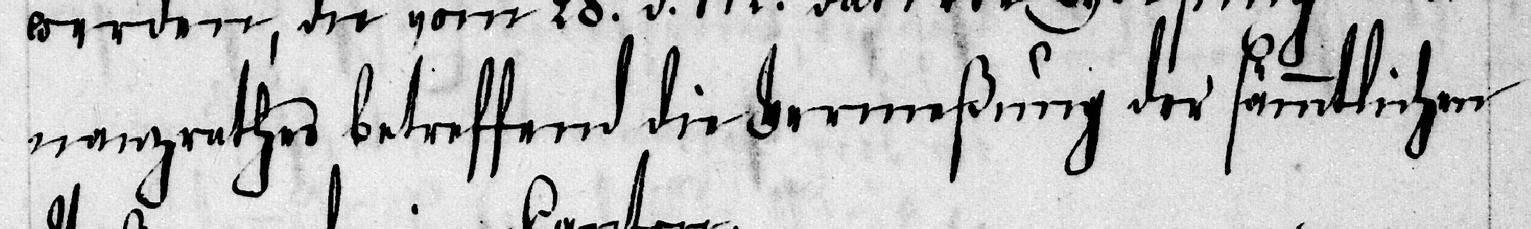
nanzrathes betreffend die Vermeßung der sämmtlichen
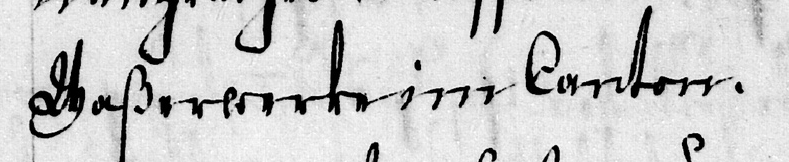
Waßerwerke im Canton.
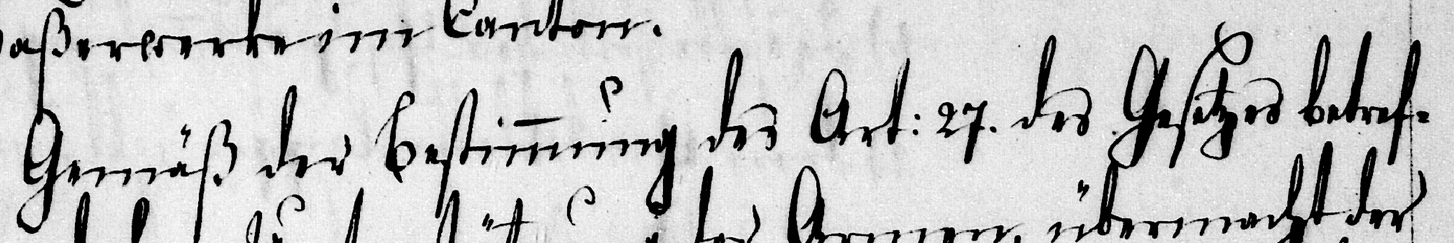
Gemäß der Bestimmung des Art: 27. des Gesetzes betr¬
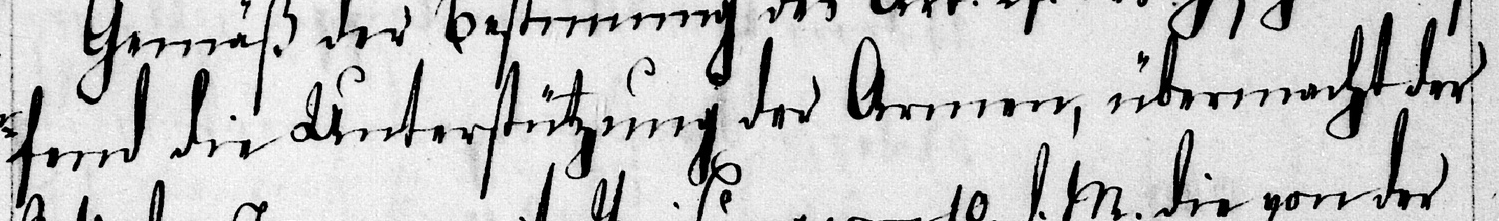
fend die Unterstützung der Armen, übermacht der
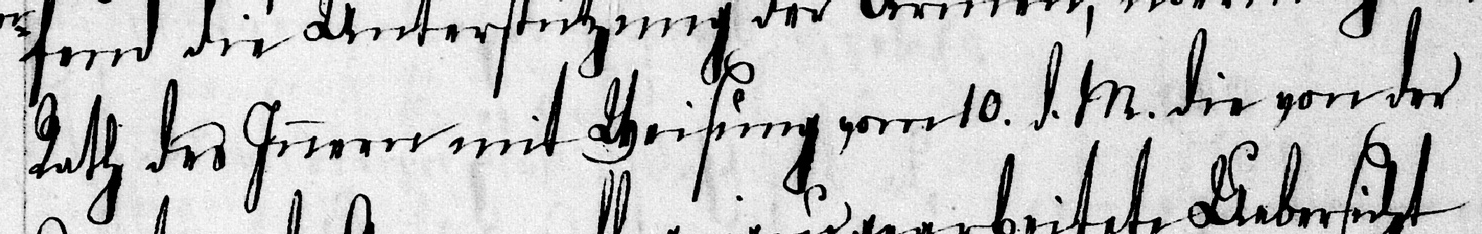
Rath des Innern mit Weisung vom 10. d. M. die von der
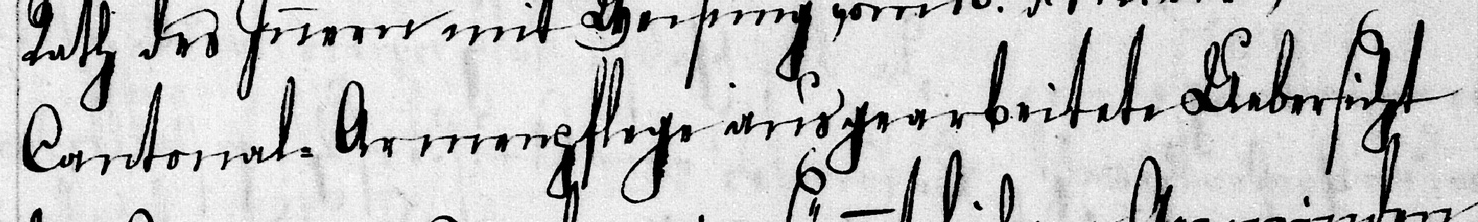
Cantonal-Armenpflege ausgearbeitete Uebersicht
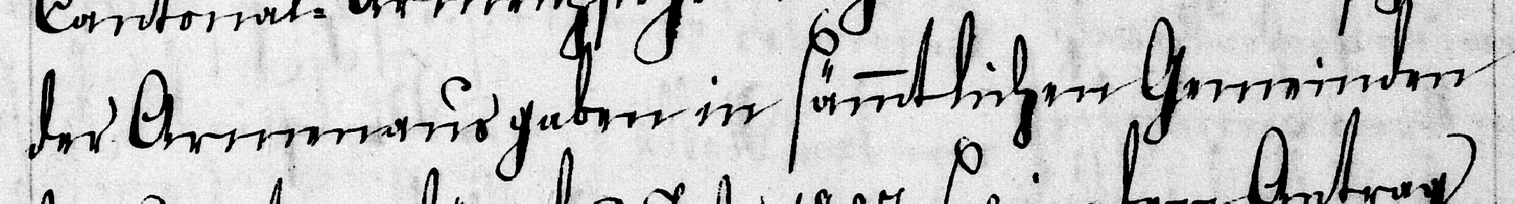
der Armenausgaben in sämmtlichen Gemeinden
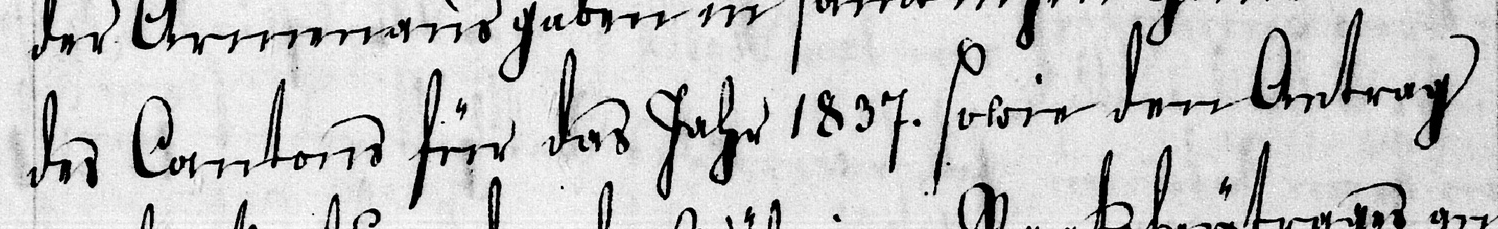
des Cantons für das Jahr 1837. sowie den Antrag
